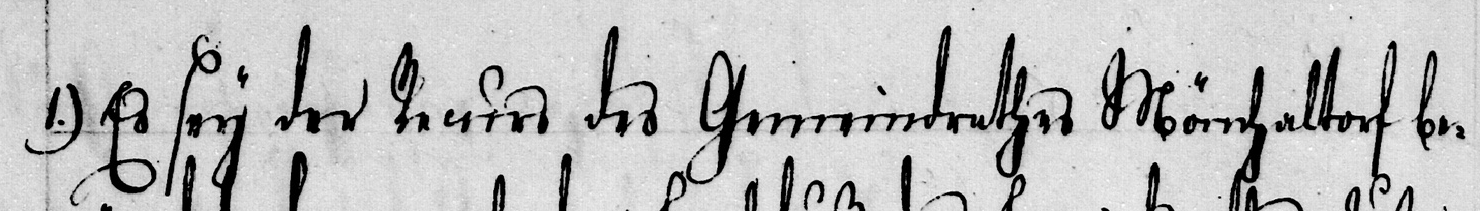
1.) Es sey der Recurs des Gemeindrathes Mönchaltorf be¬
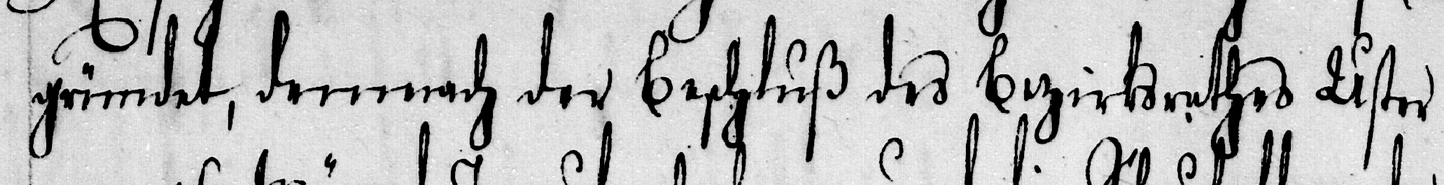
gründet, demnach der Beschluß des Bezirksrathes Uster
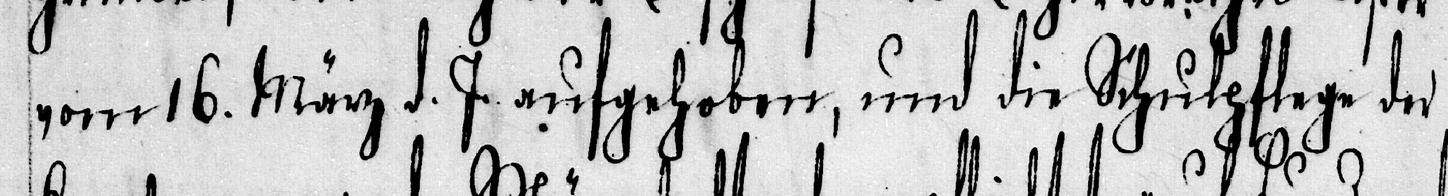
vom 16. März d. J. aufgehoben, und die Schulpflege der
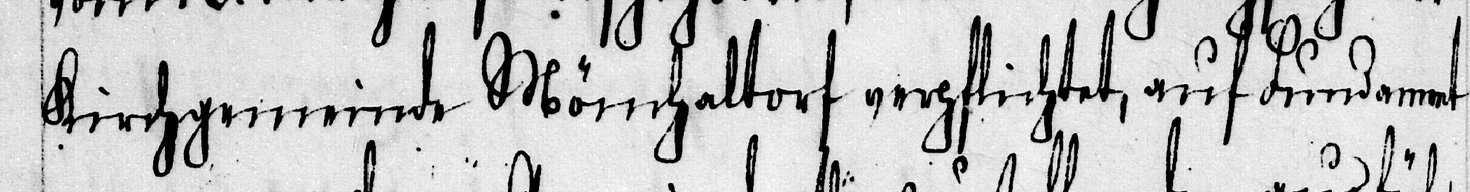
Kirchgemeinde Mönchaltorf verpflichtet, auf Fundament
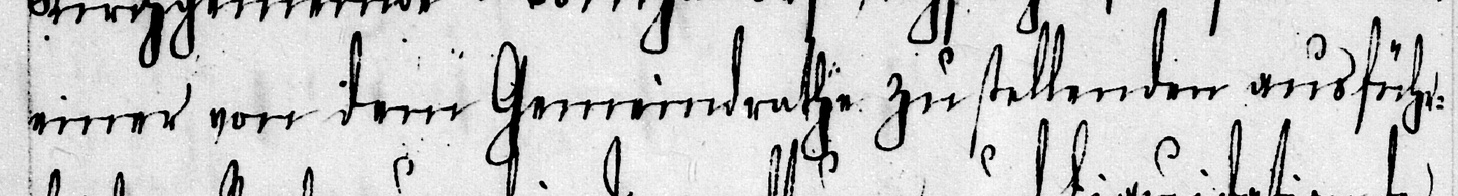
einer von dem Gemeindrathe zu stellenden ausfüh¬
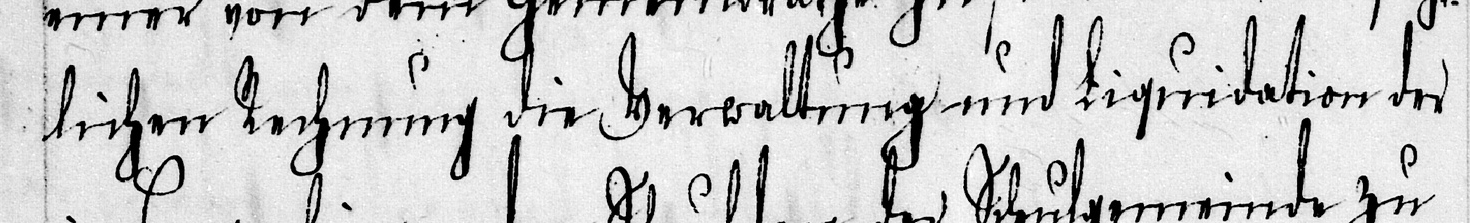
rlichen Rechnung die Verwaltung und Liquidation der
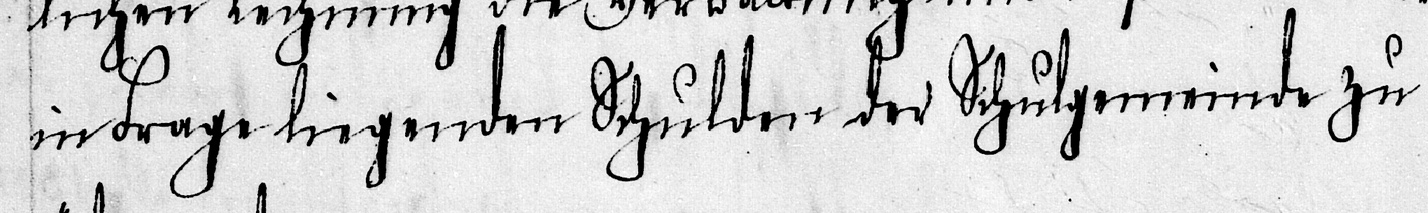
in Frage liegenden Schulden der Schulgemeinde zu
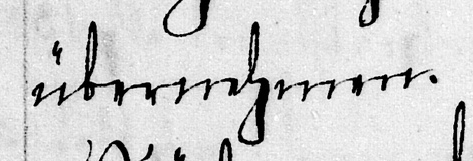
übernehmen.
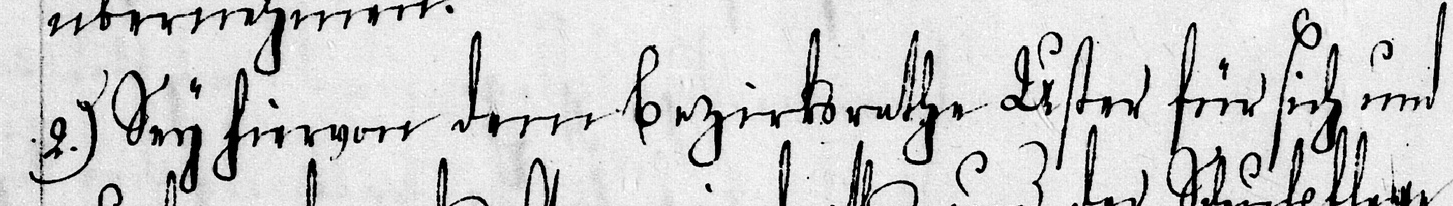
2.) Sey hiervon dem Bezirksrathe Uster für sich und
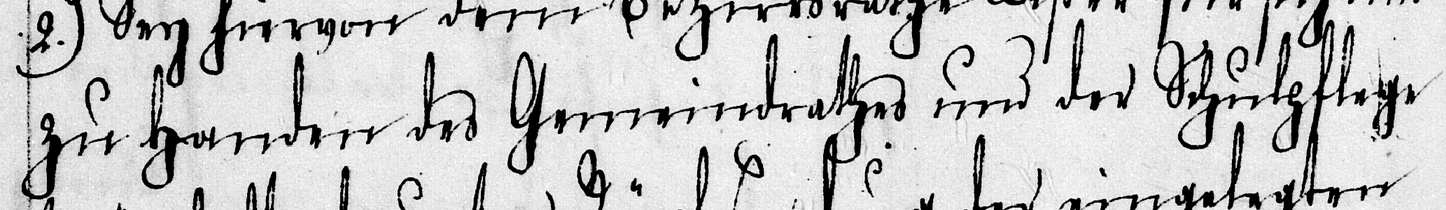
zu Handen des Gemeindrathes und der Schulpflege
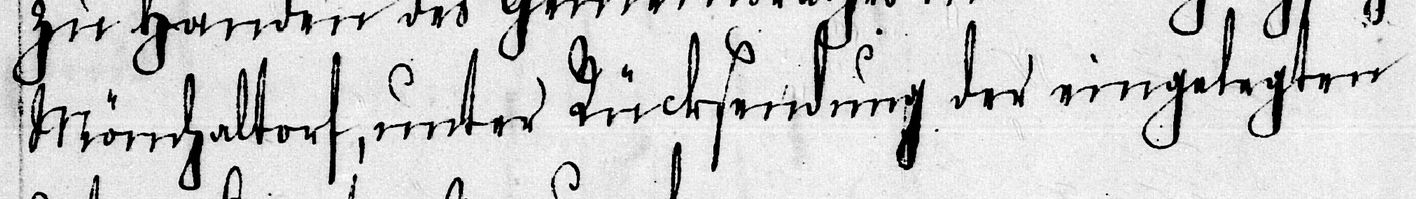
Mönchaltorf, unter Rücksendung der eingelegten
